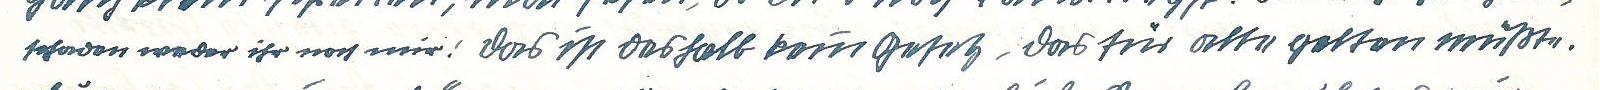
schaden weder ihr noch mir! Das ist deshalb kein Gesetz, das für alle gelten müßte.
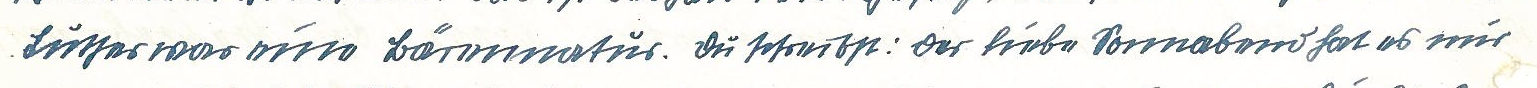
Luther war eine Bärennatur. Du schreibst: der liebe Sonnabend hat es mir
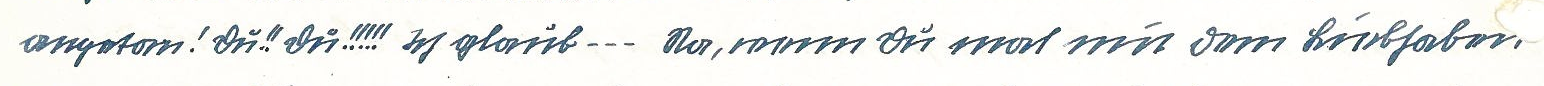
angetan! Du!! Du!!!!! Ich glaub – – – Na, wenn Du mal mit dem Liebhaben
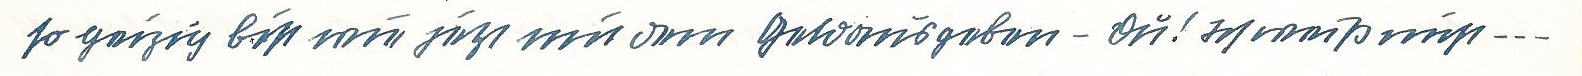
so gierig bist wie jetzt mit dem Geldausgeben – Du! Ich weiß nicht – – –
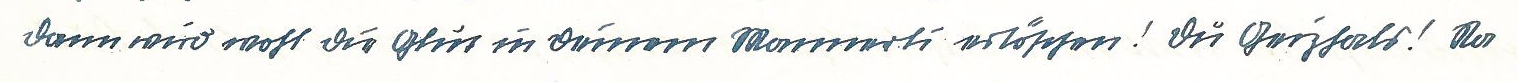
dann wird wohl die Glut in Deinem Mannerli erlöschen! Du Geizhals! Na
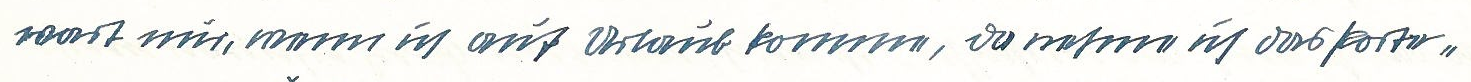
wart nur, wenn ich auf Urlaub komme, da nehme ich das Porte¬
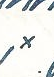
x
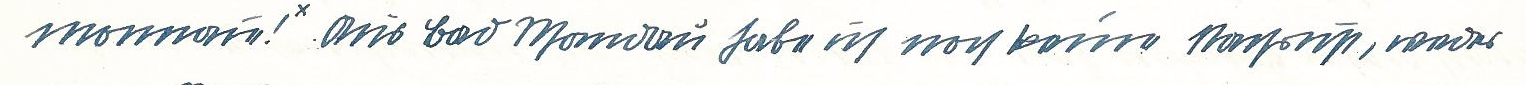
monnaie! Aus B.S. habe ich noch keine Nachricht, weder
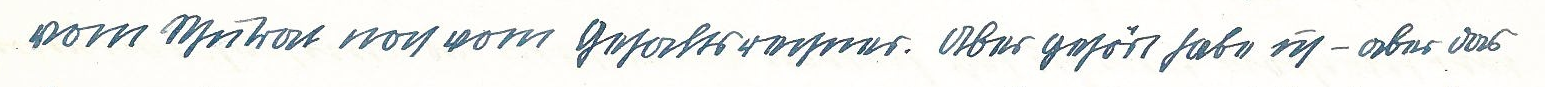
vom Schulrat noch vom Gehaltsrechner. Aber gehört habe ich – aber das
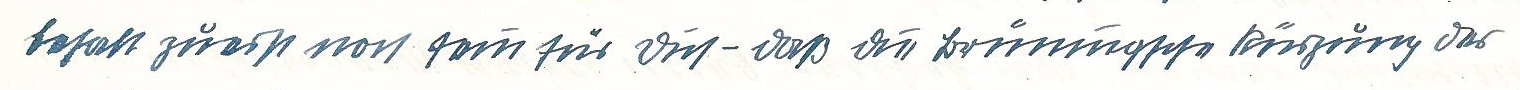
behalt zuerst noch fein für Dich – daß die Brüningsche Kürzung der
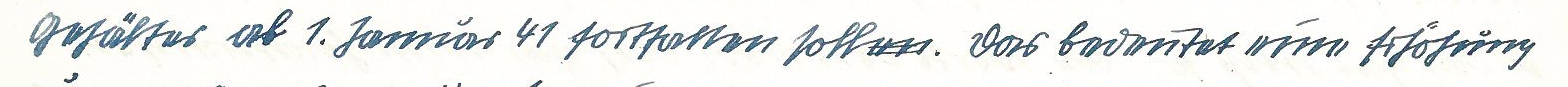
Gehälter ab 1. Januar 41 fortfallen sollen. Das bedeutet eine Erhöhung
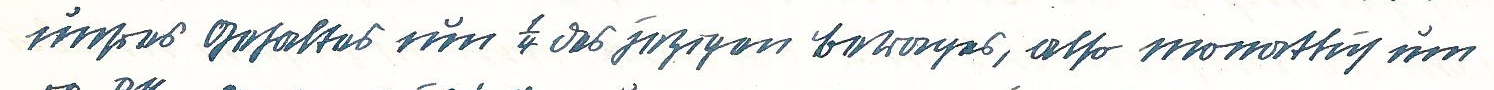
unsres Gehaltes um ¼ des jetzigen Betrages, also monatlich um
